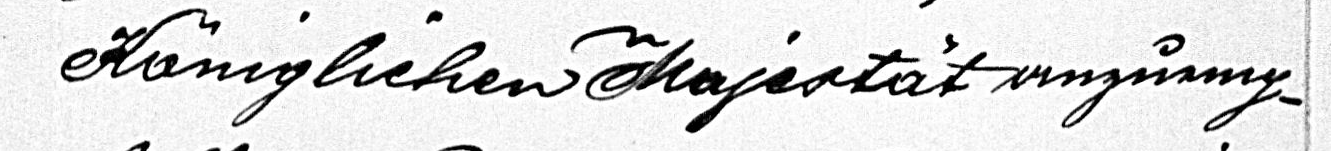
Königlichen Majestät anzuemp¬
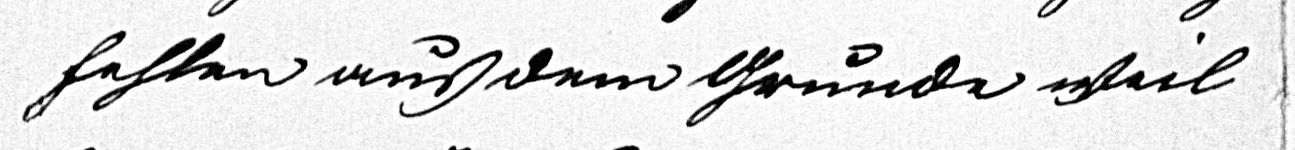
fehlen aus dem Grunde weil
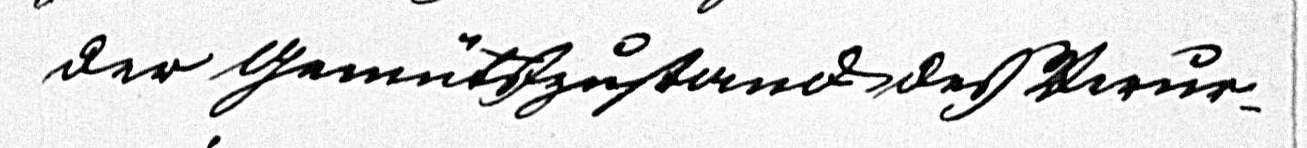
der Gemütszustand des Verur¬
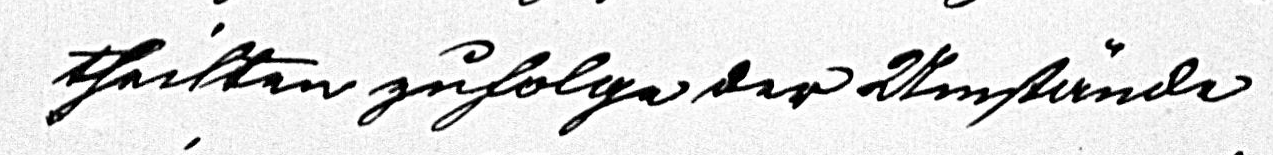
theilten zufolge der Umstände
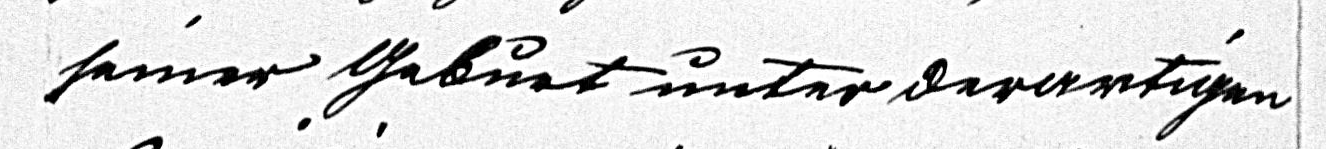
seiner Geburt unter derartigen
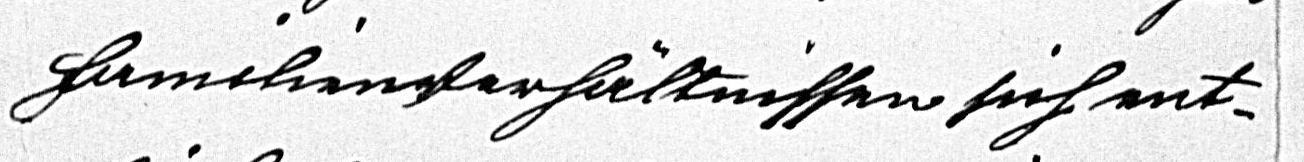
Familienverhältnissen sich ent¬
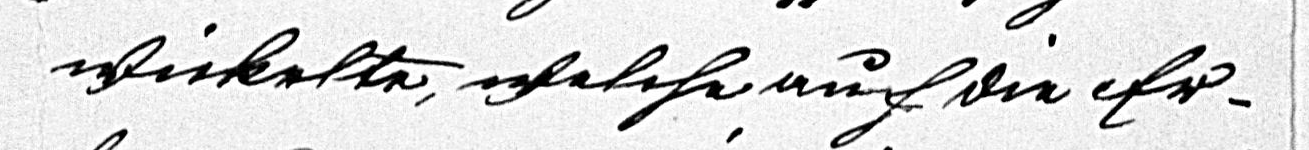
wickelte, welche auf die Er¬
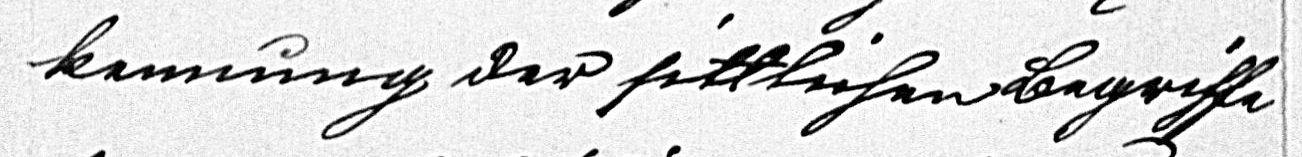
kennung der sittlichen Begriffe
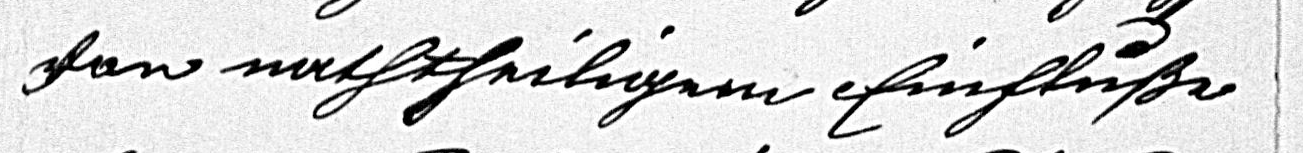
von naththeiligern Einfluße
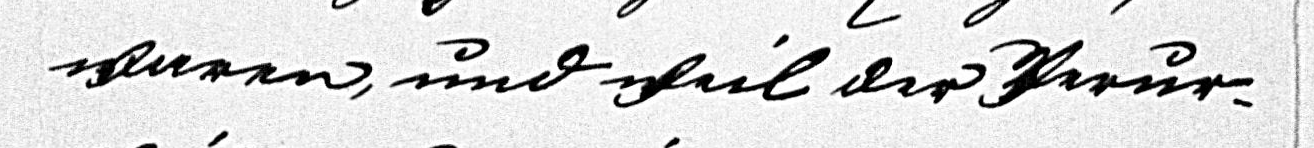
waren, und weil der Verur¬
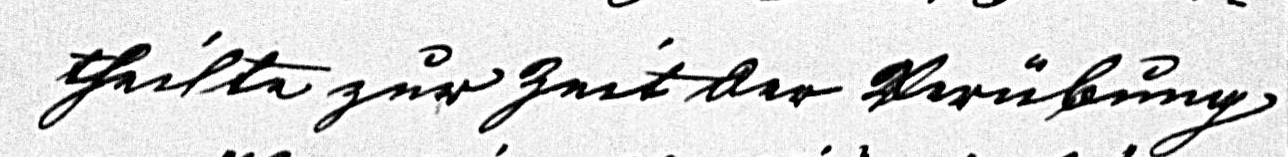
theilte zur Zeit der Verübung
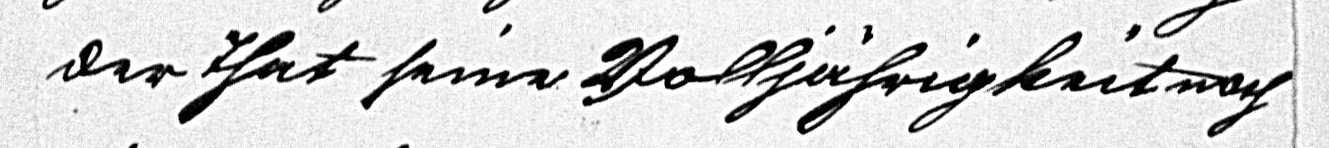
der That seine Volljährigkeit noch
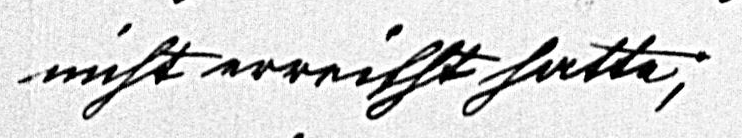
nicht erreicht hatte,
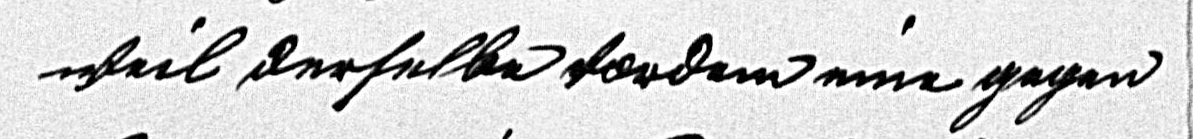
Weil derselbe vordem eine gegen
